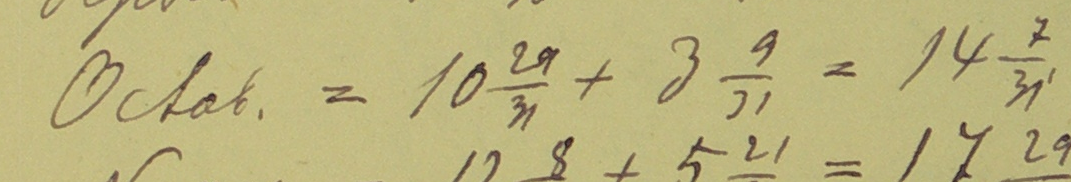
Octob. = 10 29/31 + 3 9/31 = 14 7/31
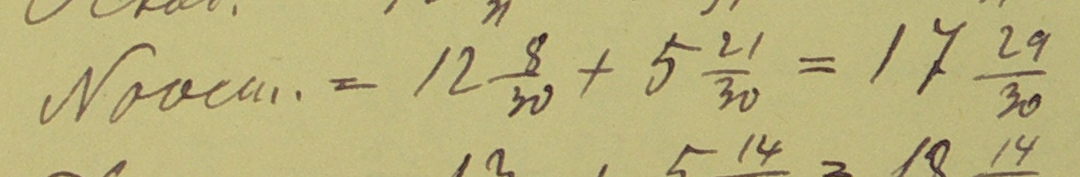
Novem. = 12 8/30 + 5 21/30 = 17 29/30
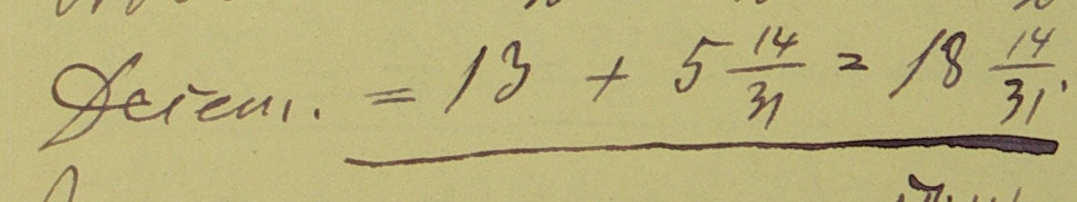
Decem. = 13 + 5 21/31 = 18 14/31
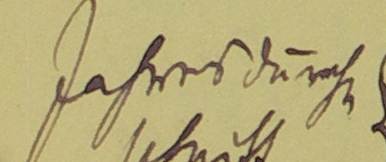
Jahres Durch¬
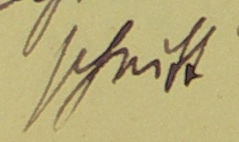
schnitt
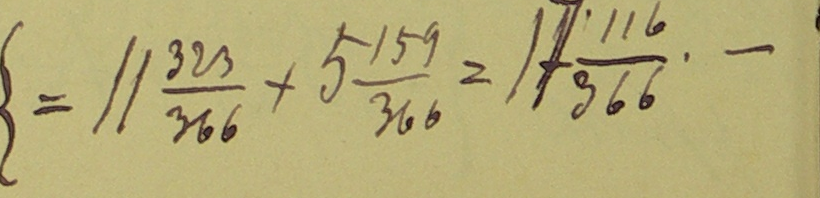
= 11 323/366 + 5 151/366 = 17 116/366
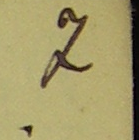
7
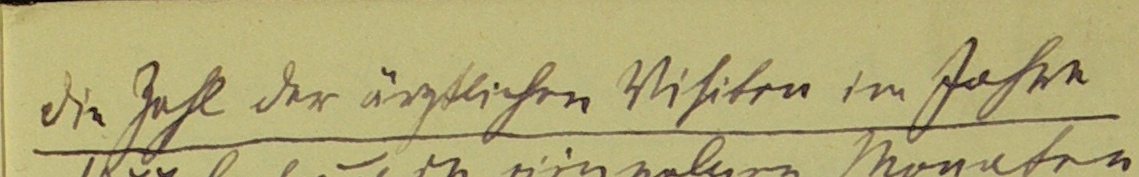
Die Zahl der ärztlichen Visiten in J.
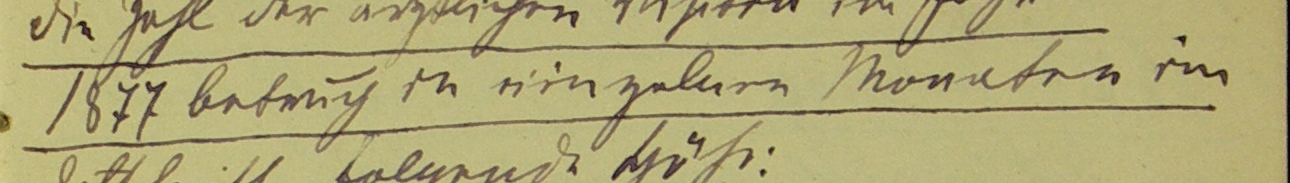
1876 betrug in einzelnen Monaten im
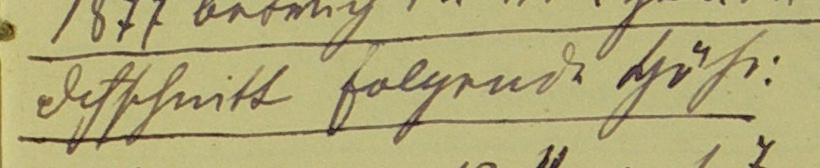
Durchschnitt folgende Höhe:
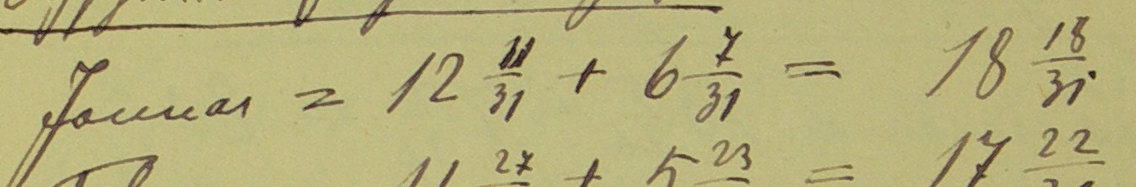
Januar = 12 11/31 + 6 7/31 = 18 18/31
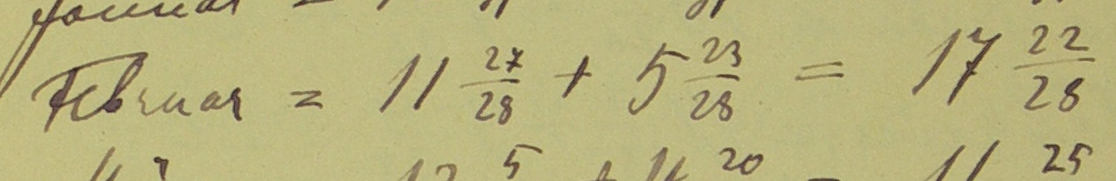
Februar = 11 11/31 + 5 23/28 = 17 22/28
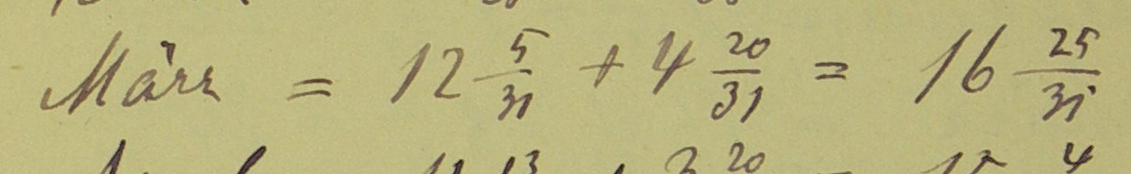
März = 12 5/31 + 4 20/31 = 16 25/31
